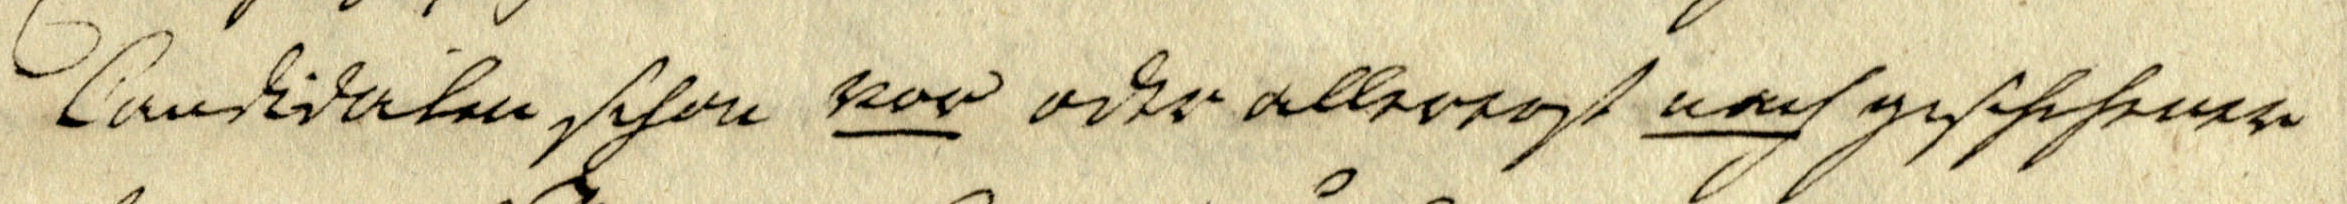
Candidaten schon vor oder allererst nach geschehener
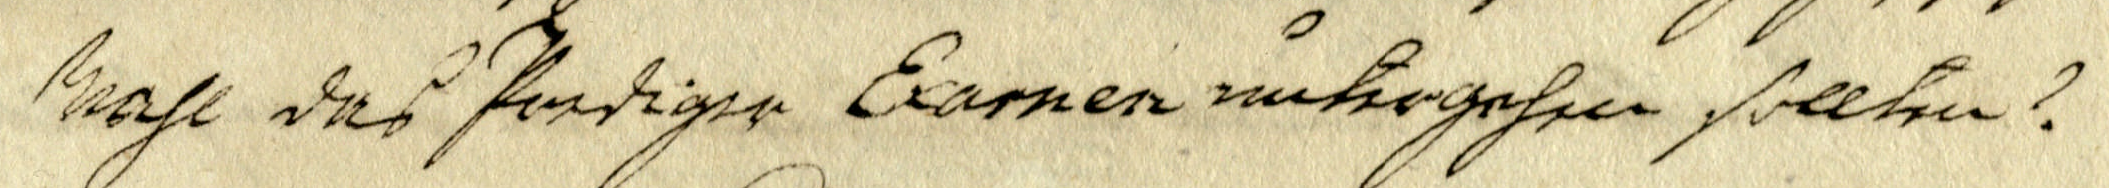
Wahl das Prediger Examen untergehen sollten?
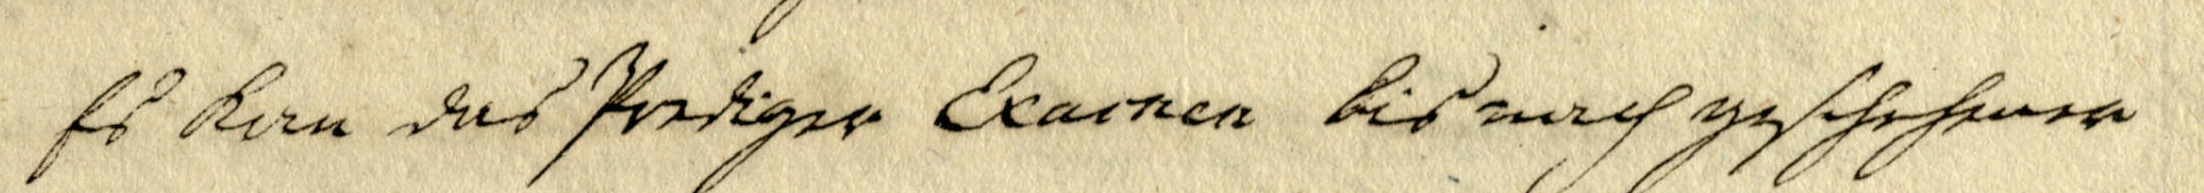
Es kan das Prediger Examen bis nach geschehener
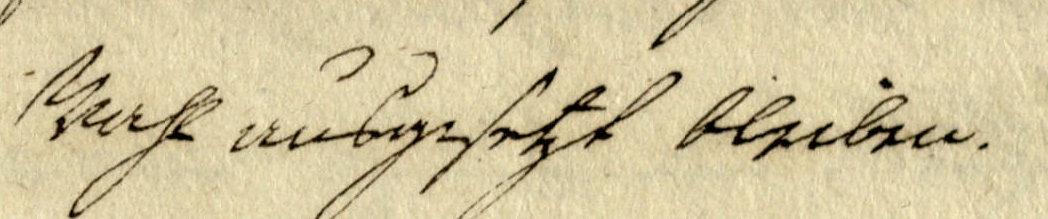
Wahl ausgesetzt bleiben.
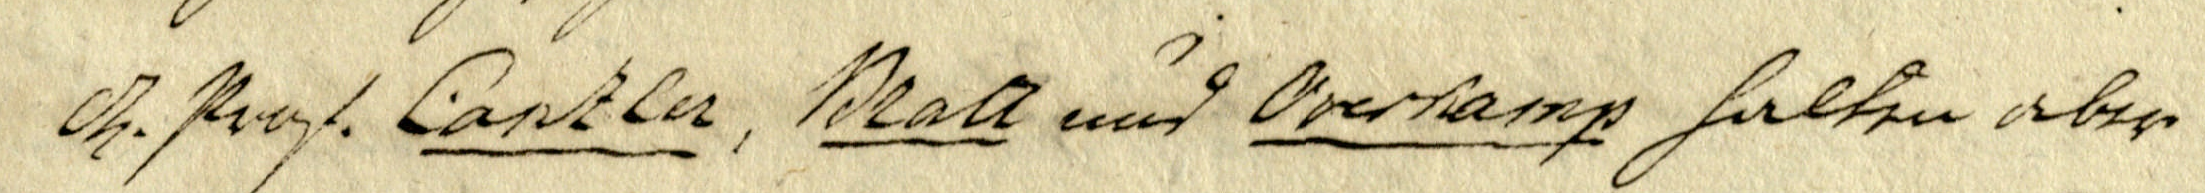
dh. Prof. Canzler, Bratt und Overkamp halten aber
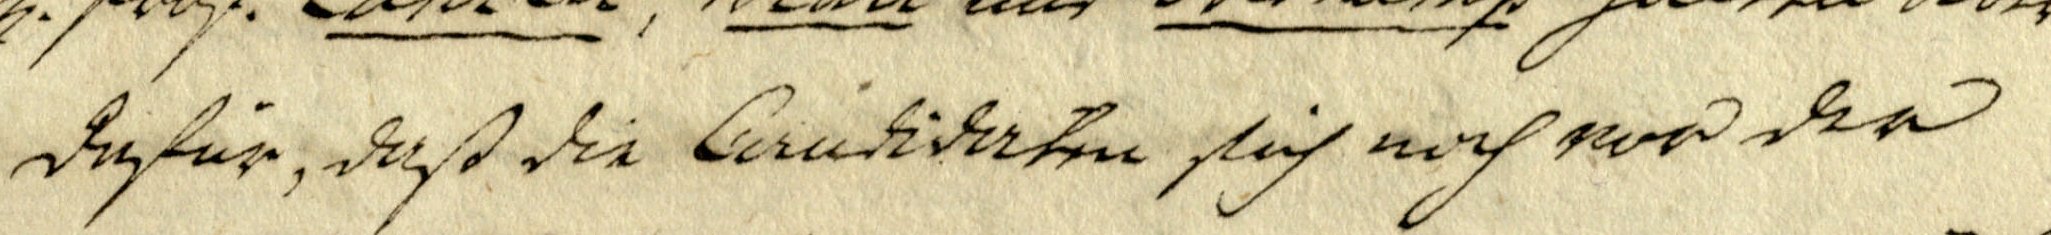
dafür, daß die Candidaten sich noch vor der
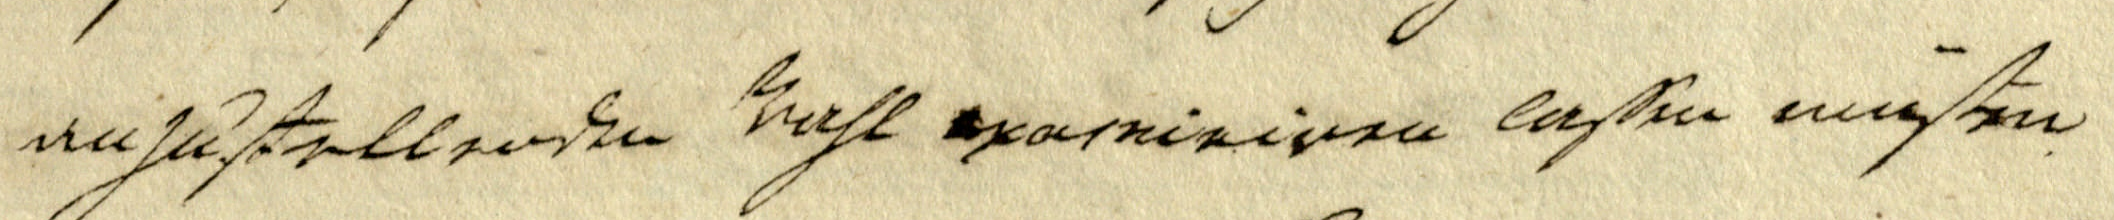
anzustellenden Wahl examiniren lassen müsten
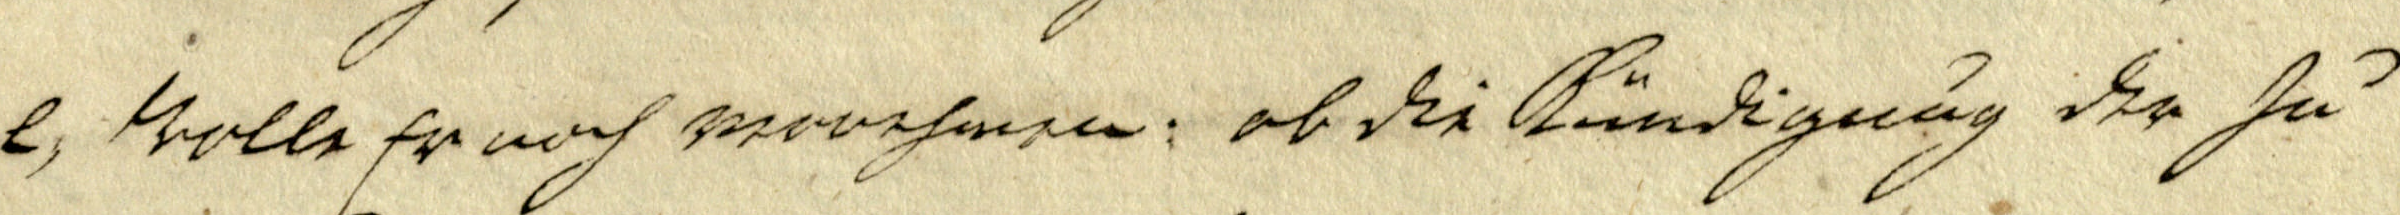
e, Wolle Er noch vernehmen: ob die Kündigung der zu
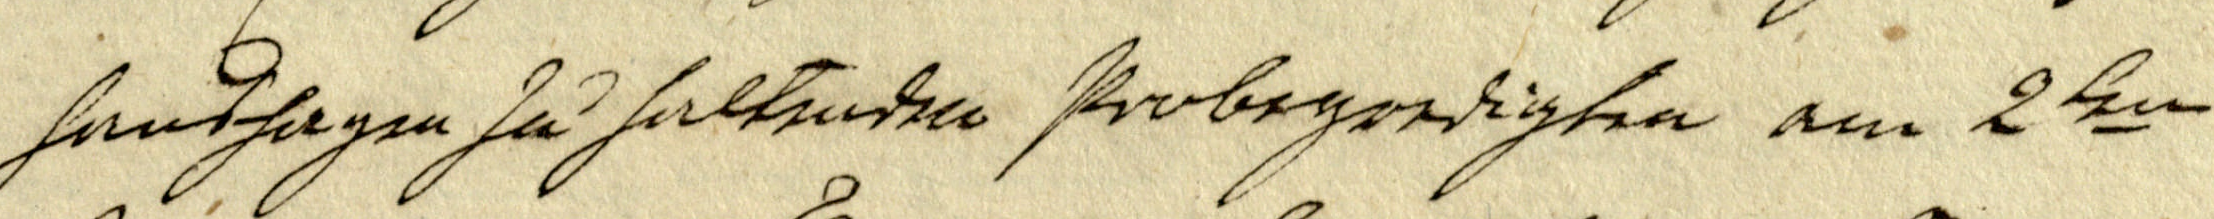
hanshagen zu haltenden Probepredigten am 2 ten
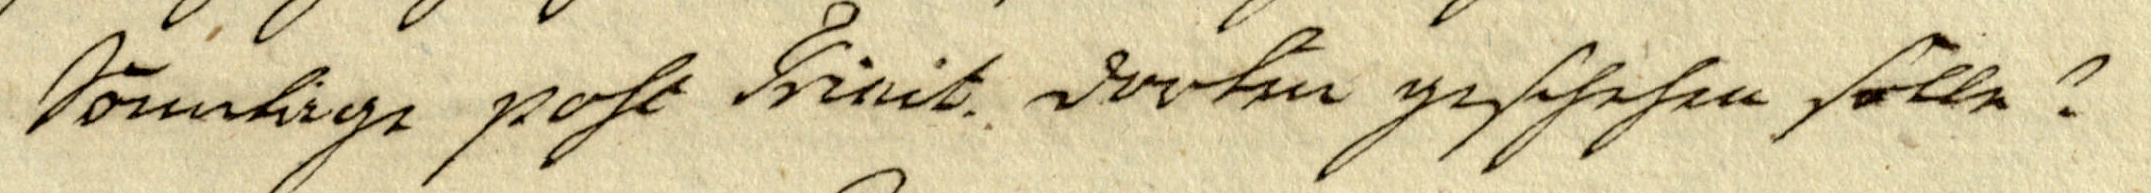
Sonntage post Trinit. dorten geschehen solle?
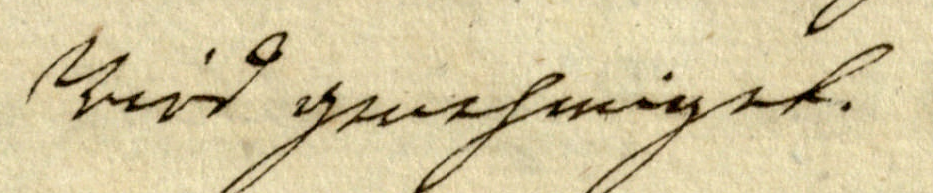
Wird genehmiget.
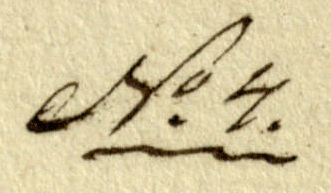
Nº 4.
